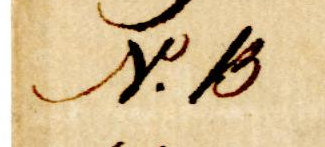N. B
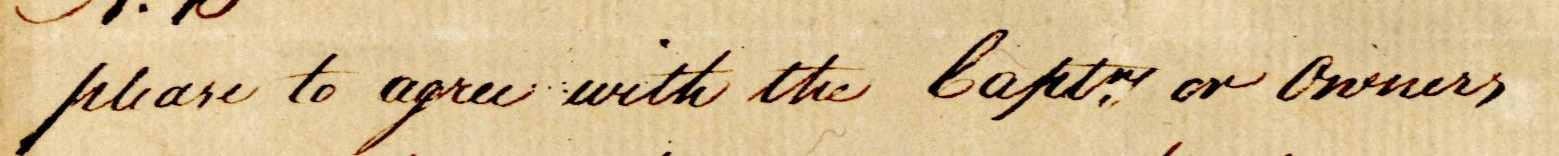please to agree with the Capt^n. or Owners
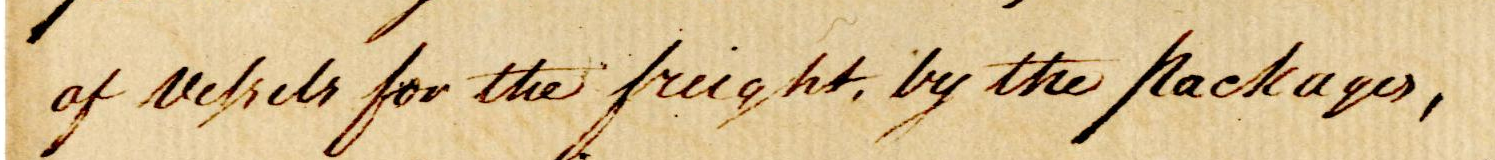of vessels for the freight by the packages,
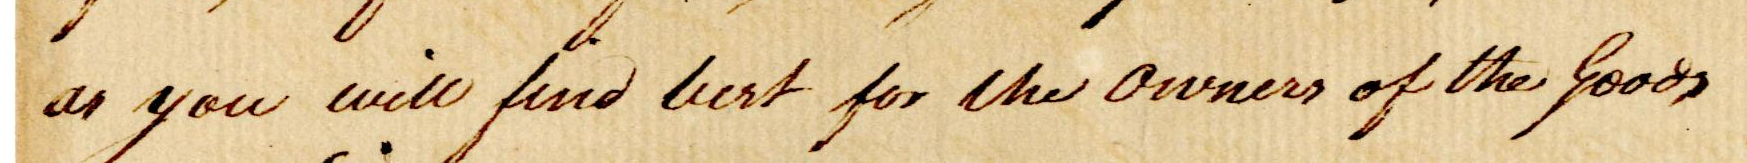as you will find best for the owners of the goods
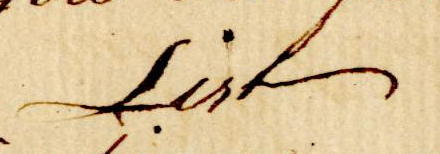List
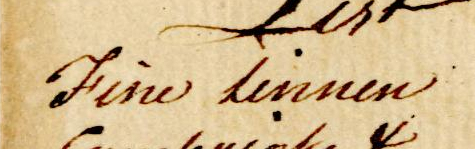Fine Linnen
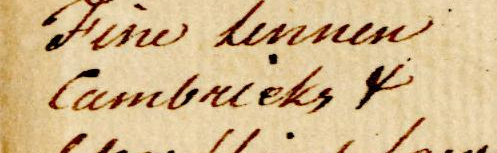cambricks &
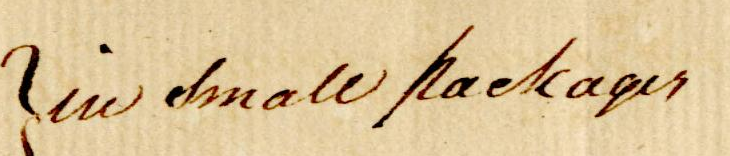in small packages
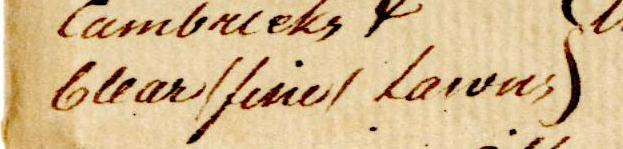Clear /fine/ Lawns
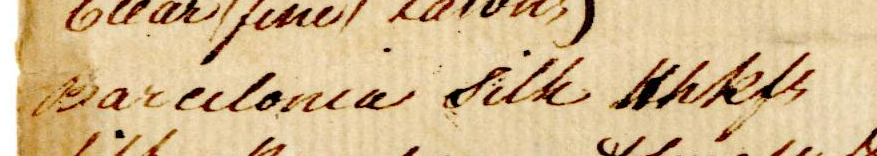Barcelonia Silk Hhkfs
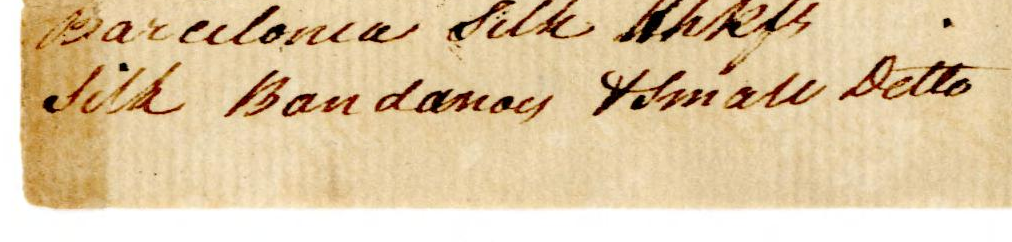Silk Bandanas & small Ditto
